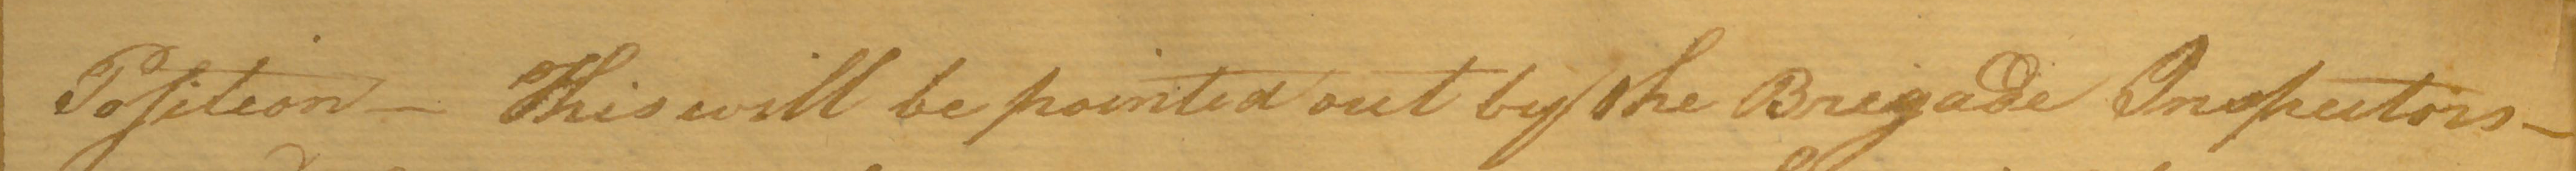Position- This will be pointed out by the Brigade Inspectors-
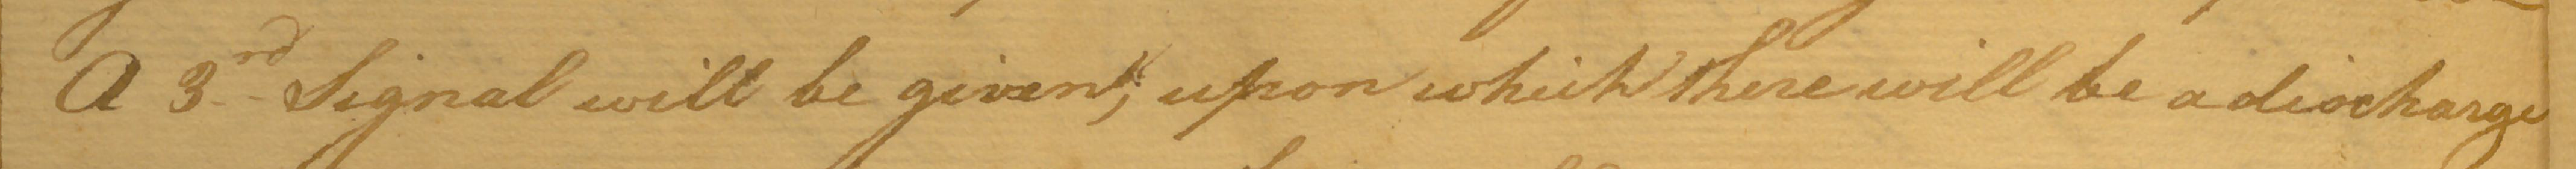A 3^rd. Signal will be given, upon which there will be a discharge
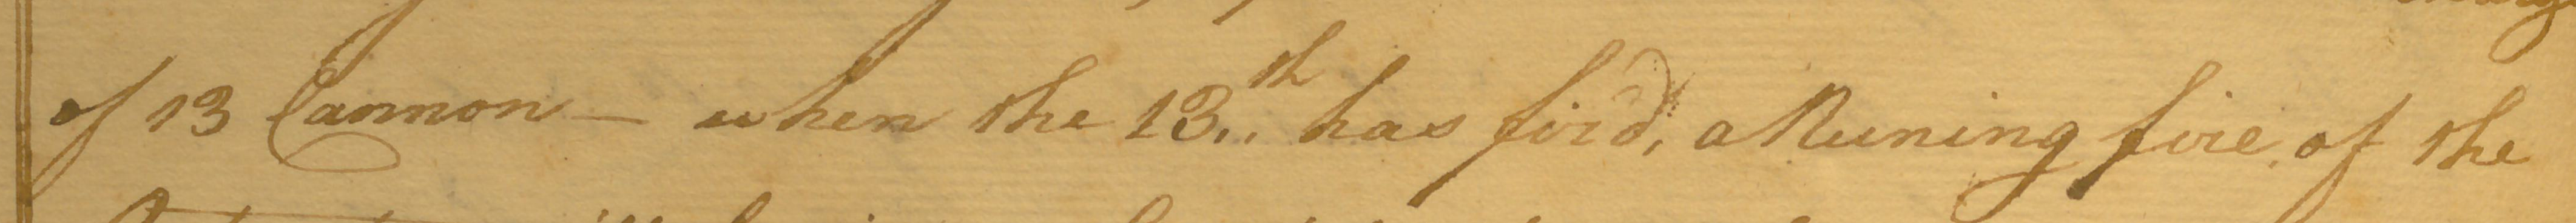of 13 Cannon- when the 13^th. has fir'd, a Runing fire of the
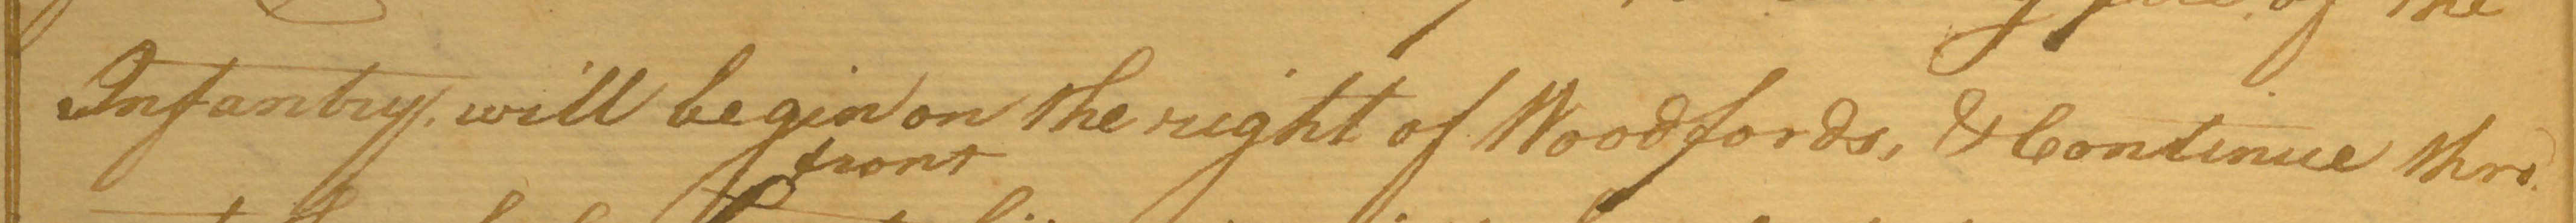Infantry will begin on the right of Woodfords, & Continue thro
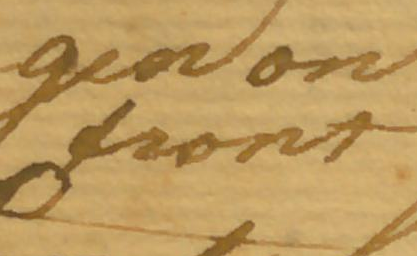front
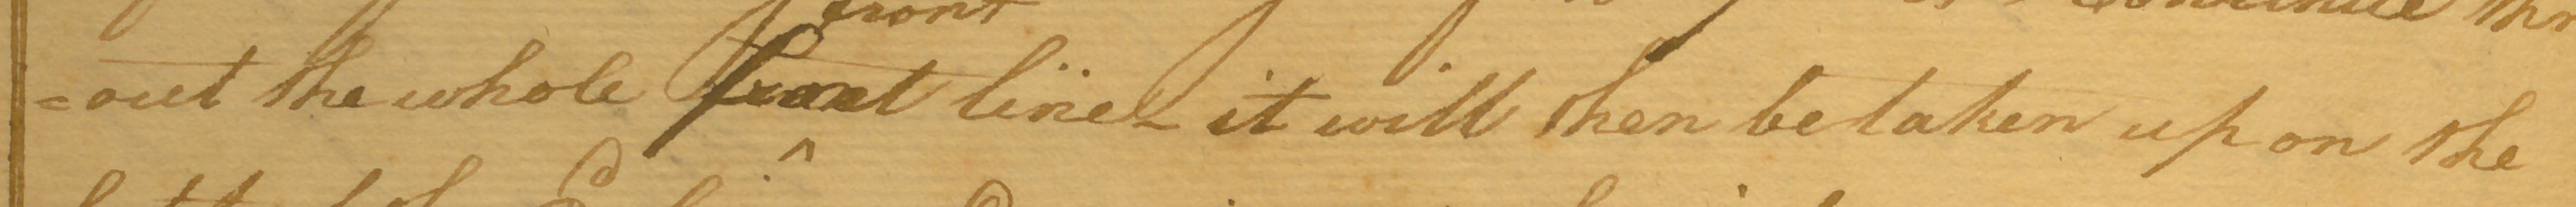-out the whole [front] line- it will then be taken up on the
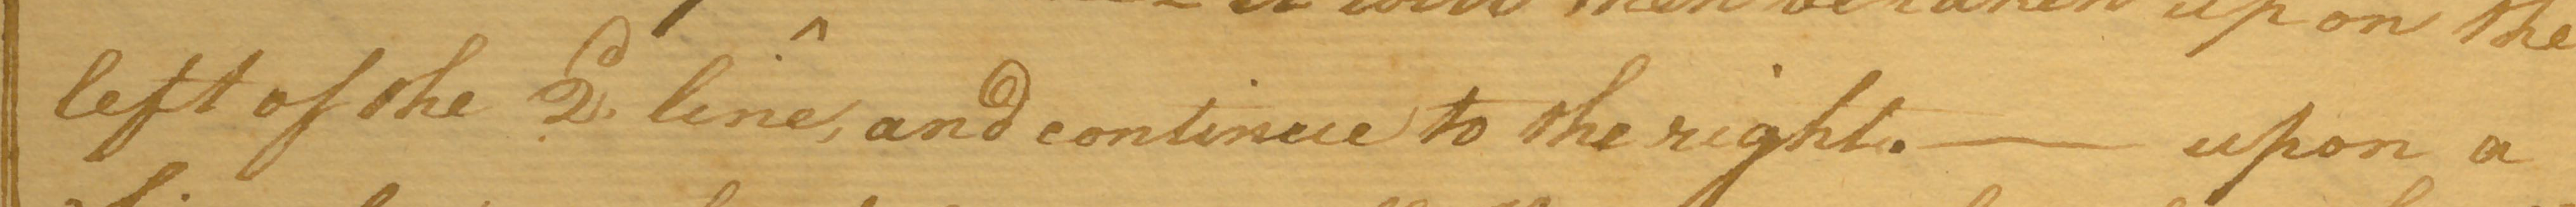left of the 2^d. line, and continue to the right.- upon a
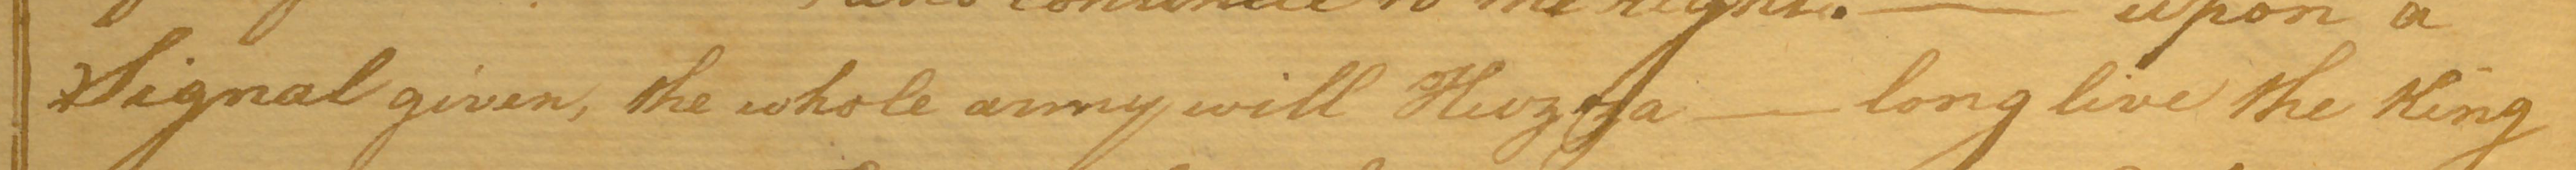Signal given, the whole army will Huzza- long live the King
